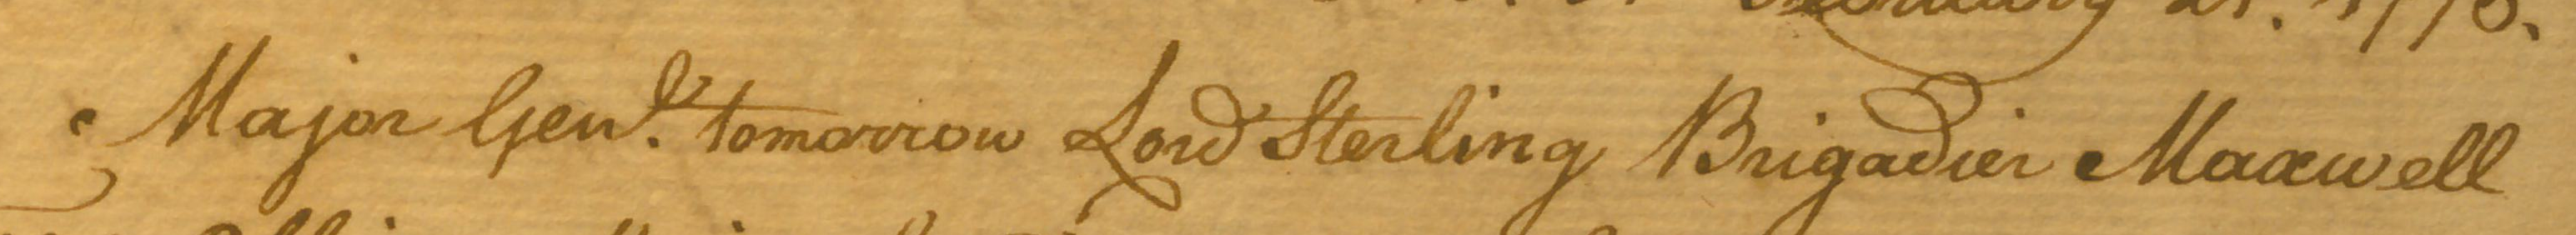Major Gen^l. tomorrow Lord Sterling Brigadier Maxwell
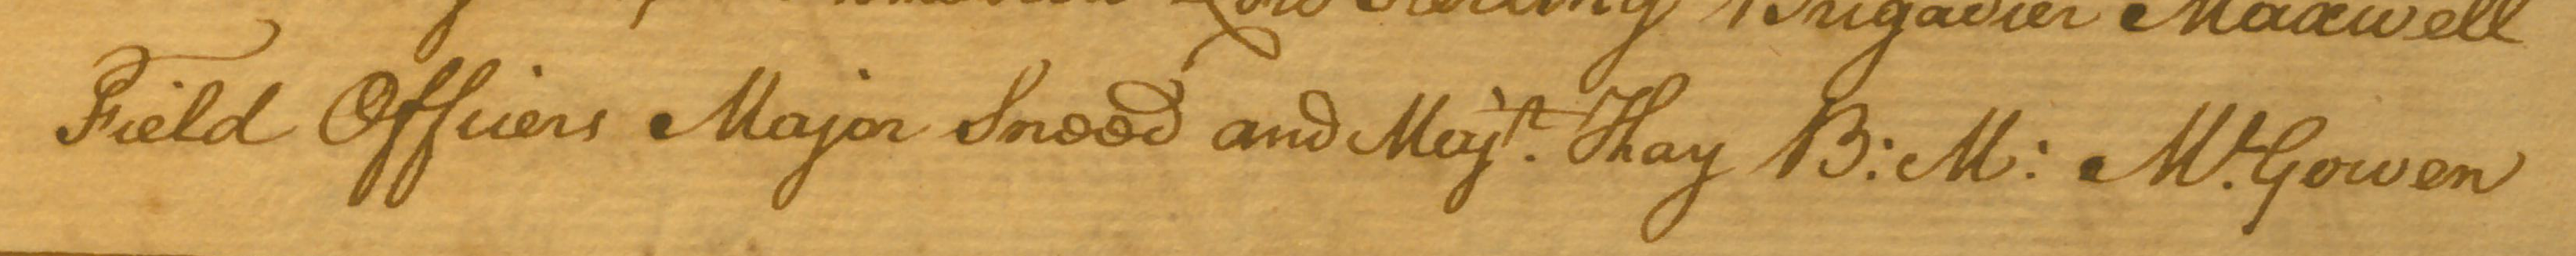Field Officers Major Sneed and Maj^r. Hay B: M: M^c.Gowen
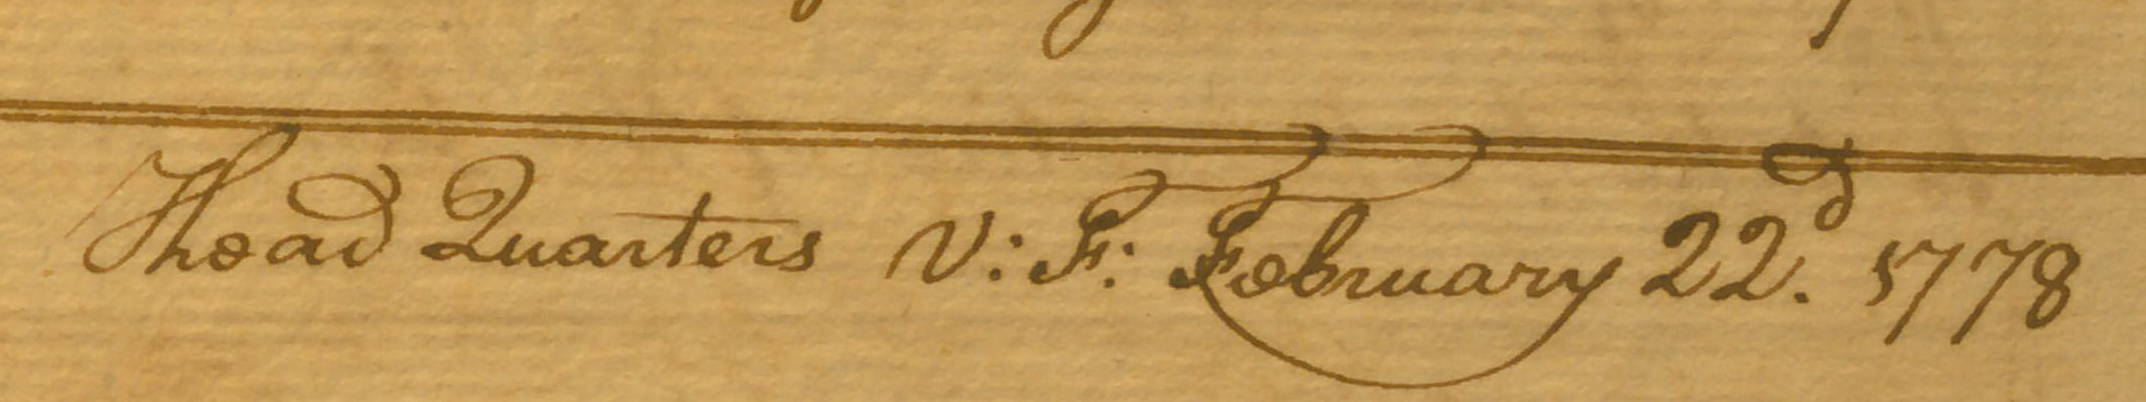Head Quarters V: F: February 22^d. 1778
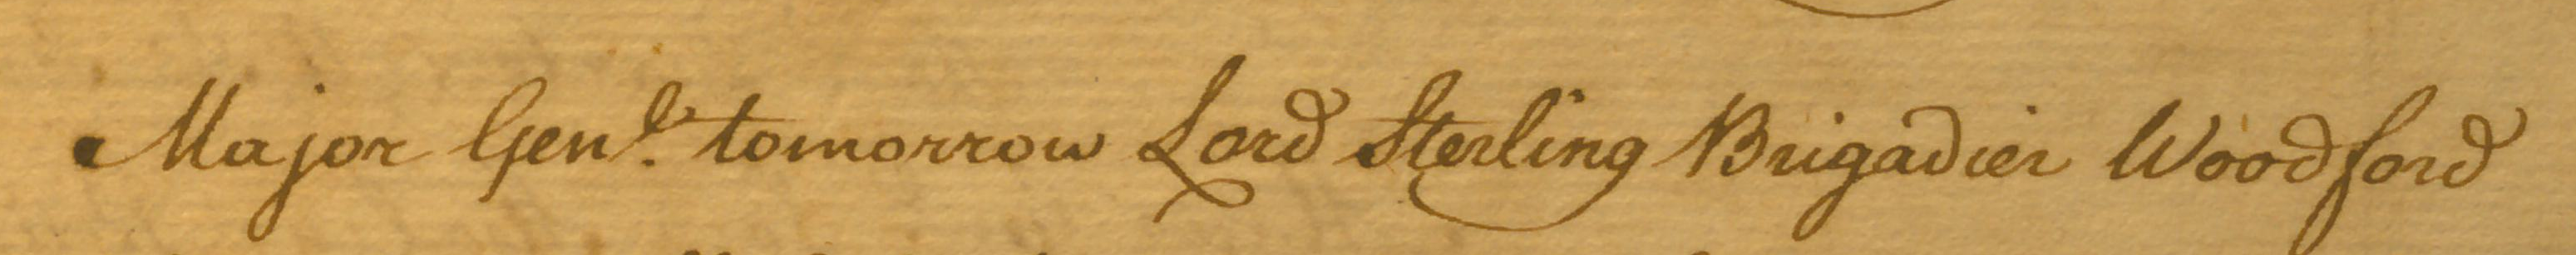Major Gen^l. tomorrow Lord Sterling Brigadier Woodford
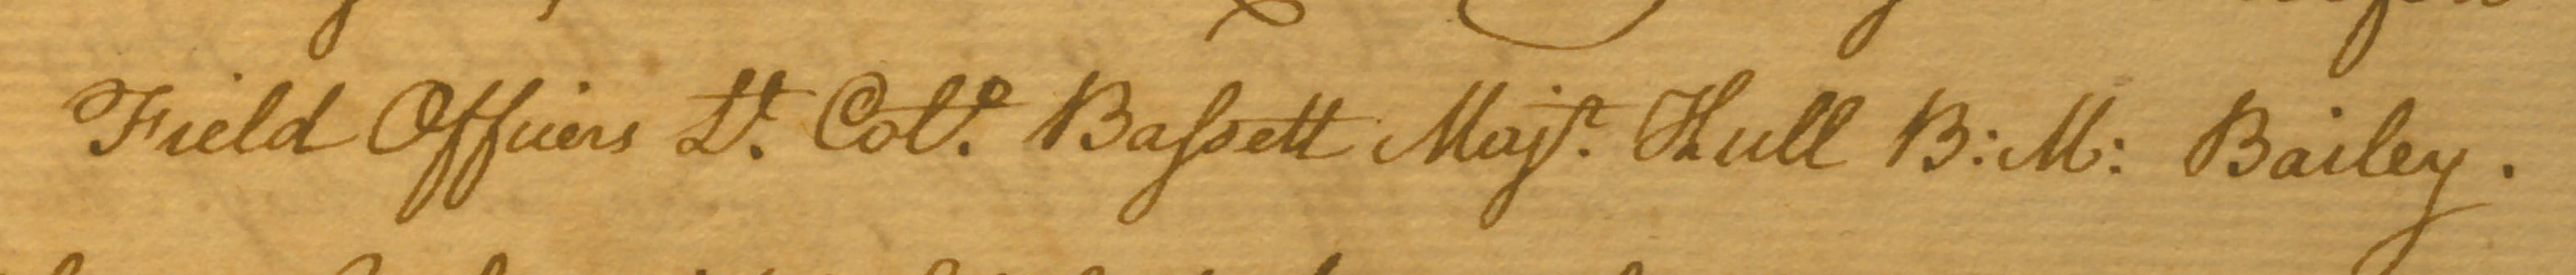Field Officers L^t. Col^o. Bassett Maj^r. Hull B: M: Bailey.
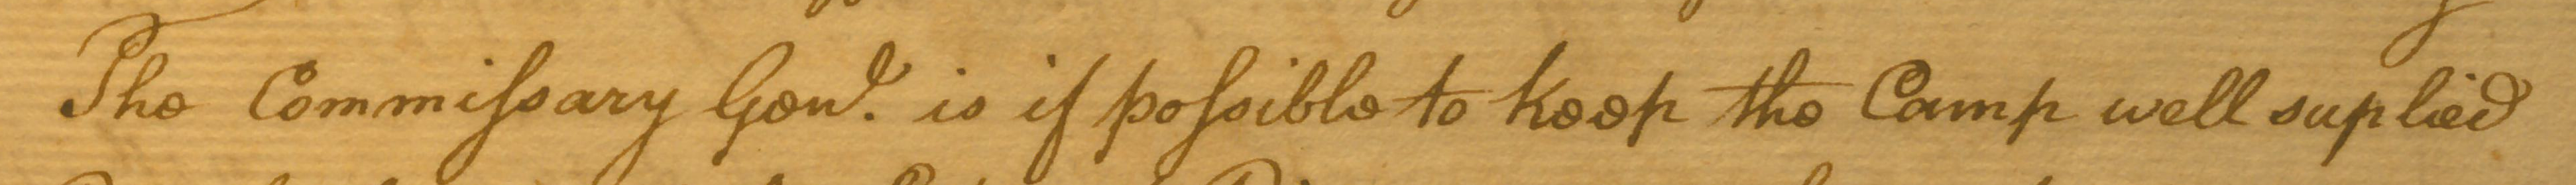The Commissary Gen^l. is if possible to keep the Camp well suplied
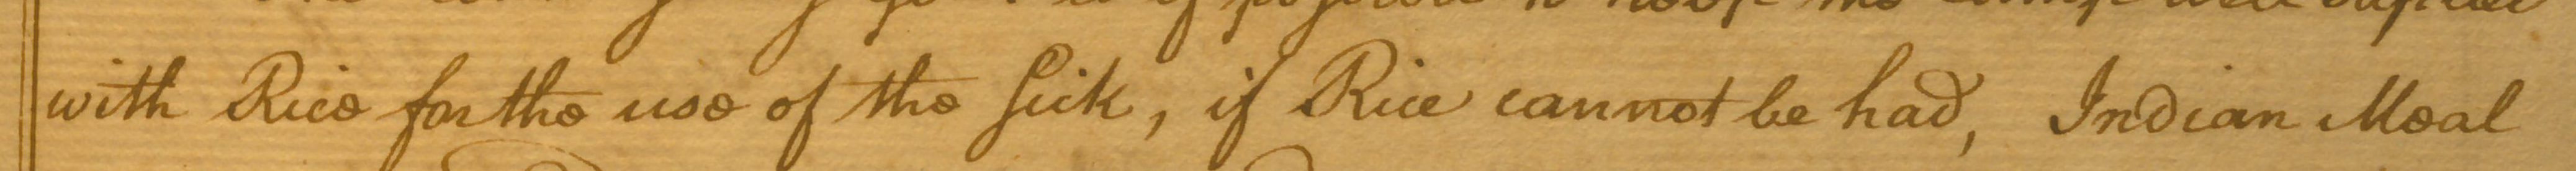with Rice for the use of the sick, if Rice cannot be had, Indian Meal
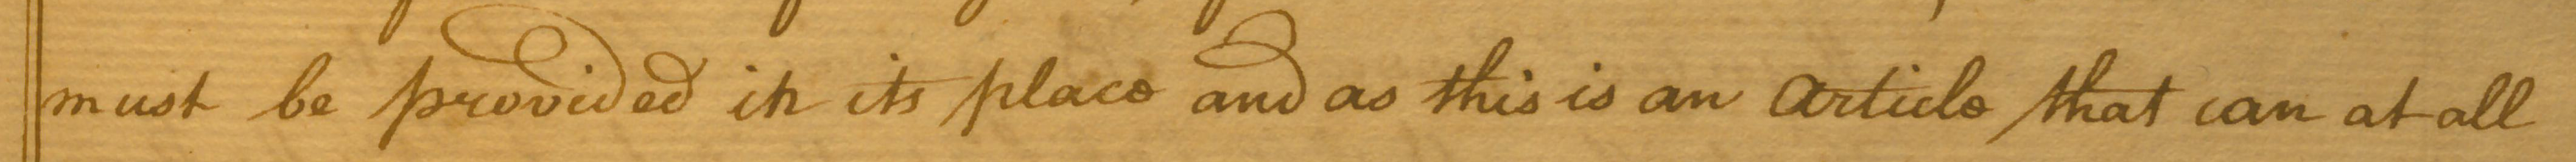must be provided in its place and as this is an article that can at all
